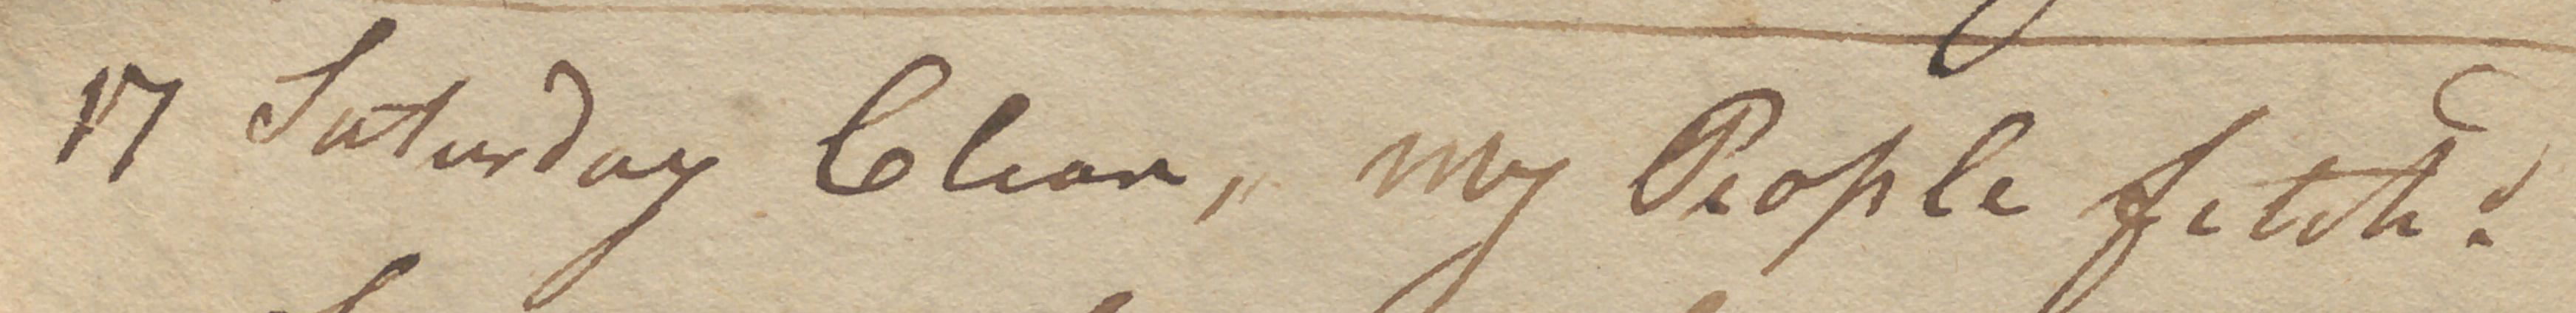17 Saturday Clear, My People fetch^d.
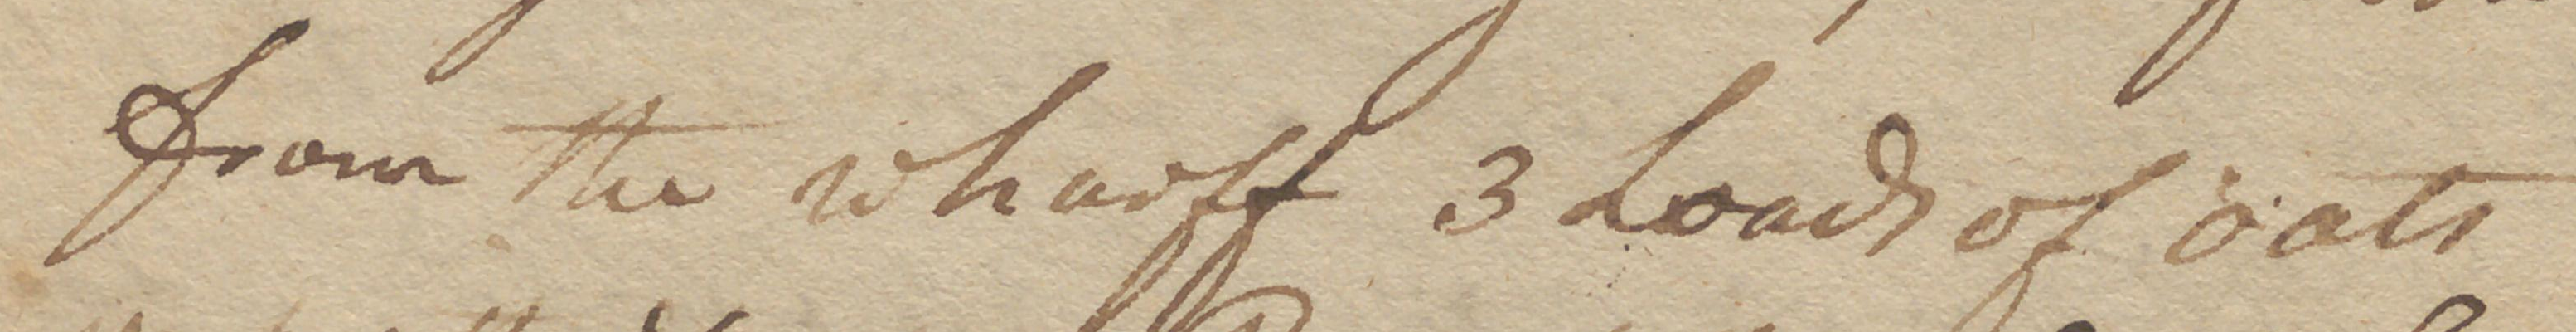from the wharff 3 Loads of oats
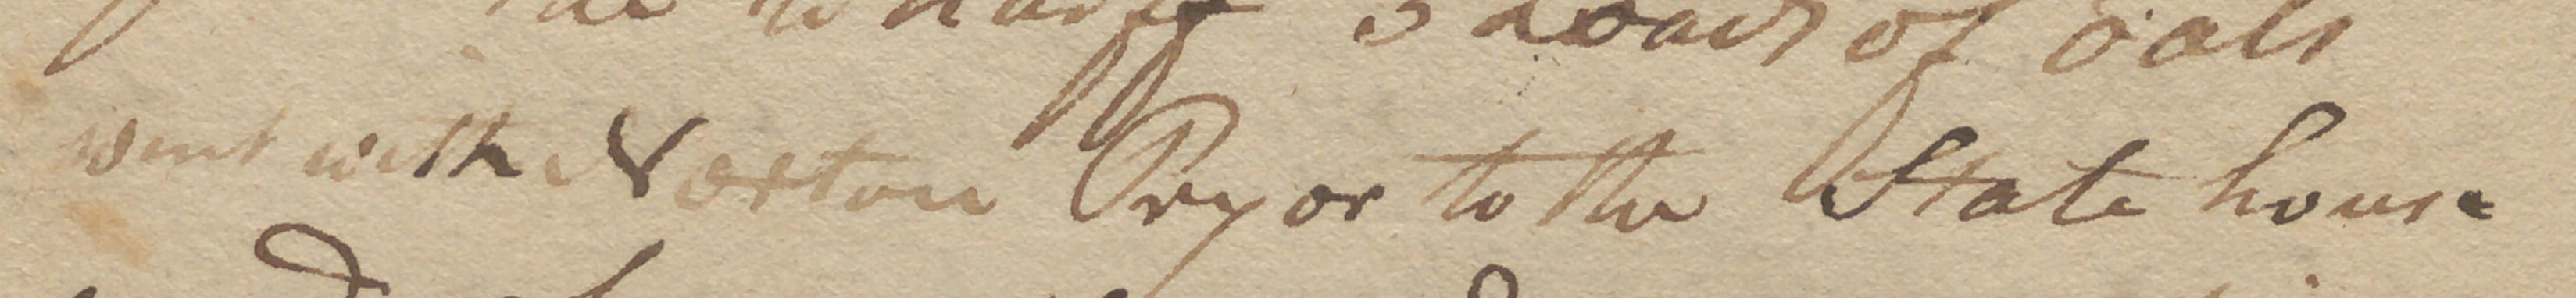went with Norton Pryor to the State house
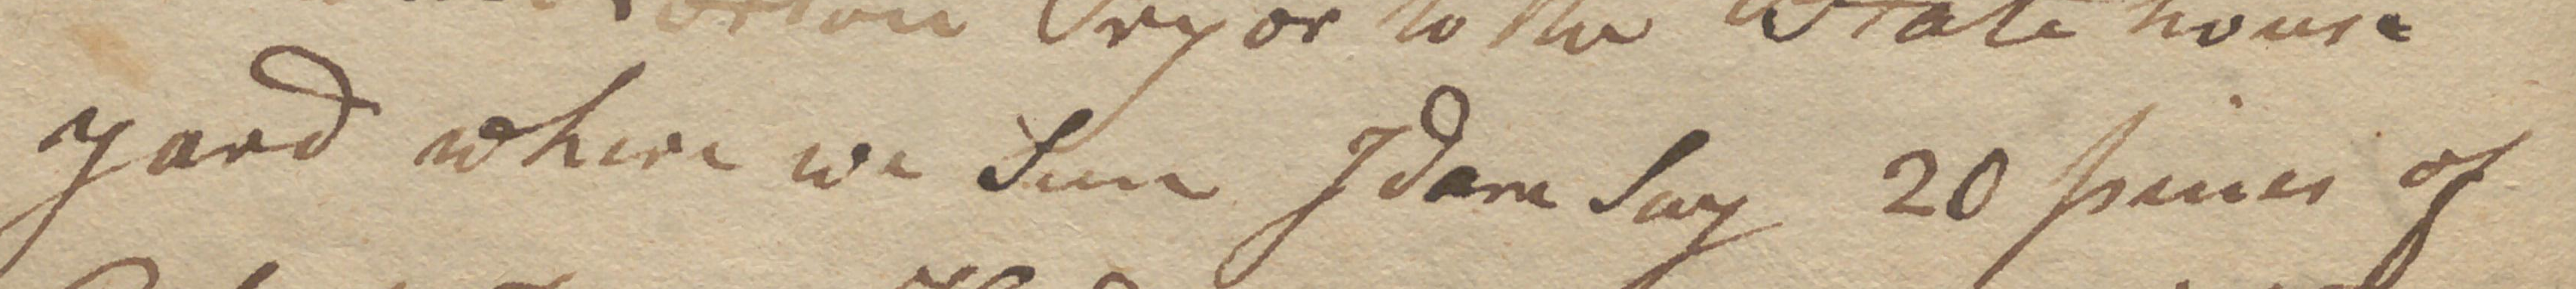yard where we seen I dare say 20 pieces of
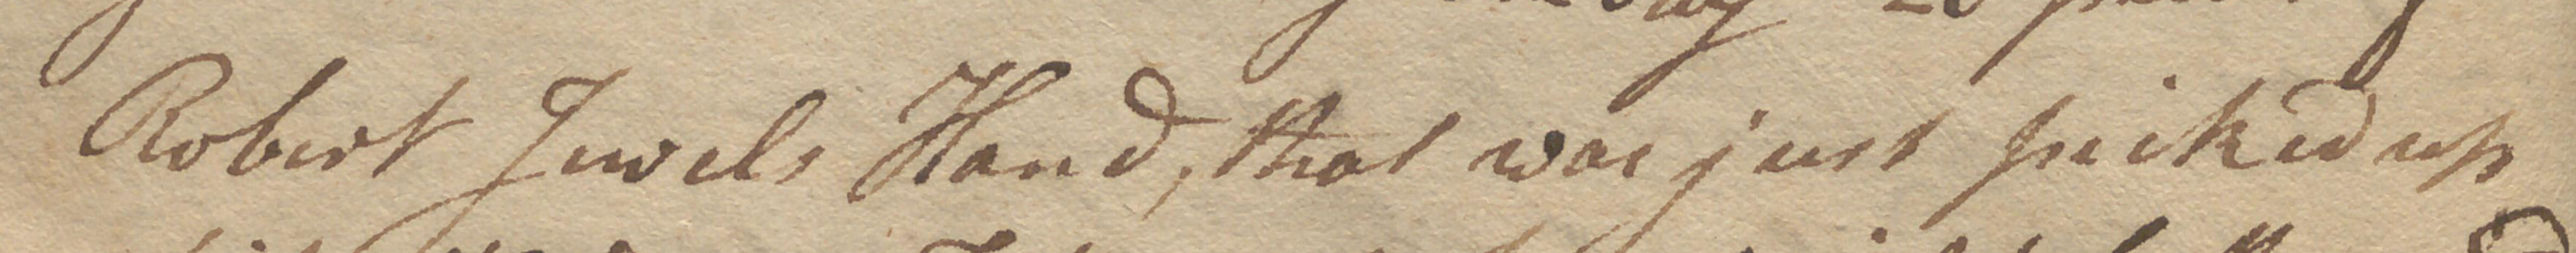Robert Jewels Hand, that was just picked up
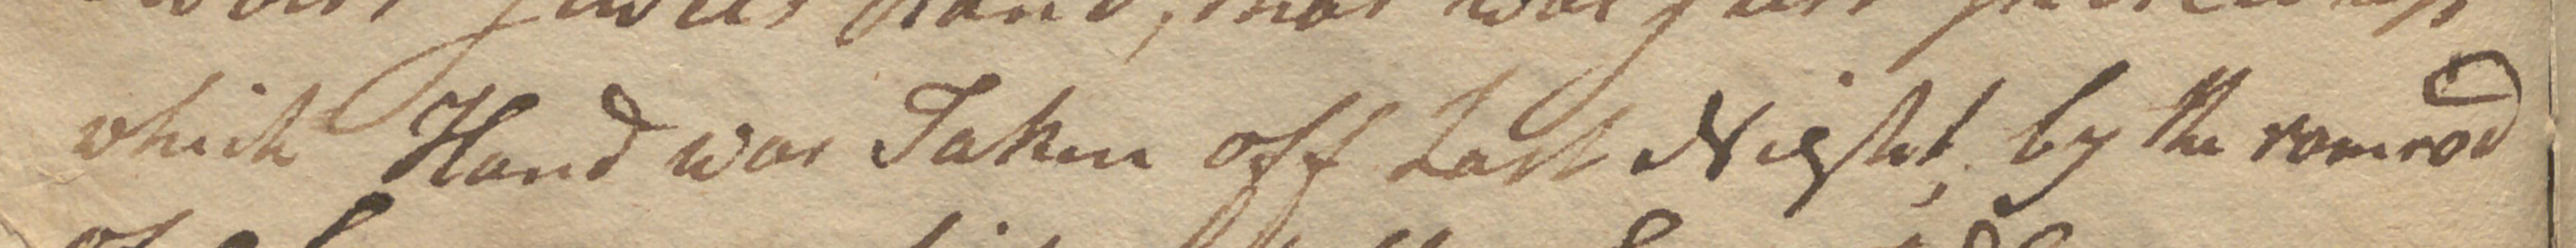which Hand was Taken off Last Night by the ramrod
